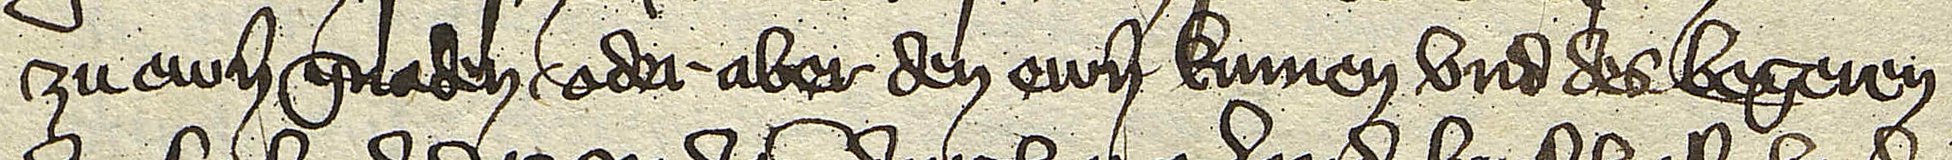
cʒu ewn* gnaden / oder aber den ew*n kumen vnd des begeren
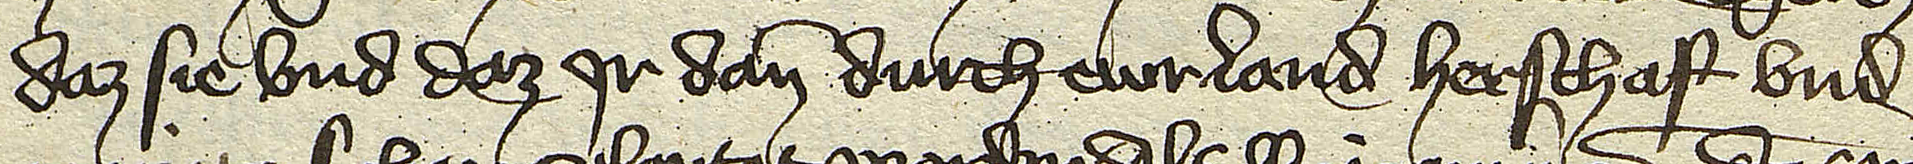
daʒ ſie vnd daʒ Ir dan* durch ewr land herſchaft vnd
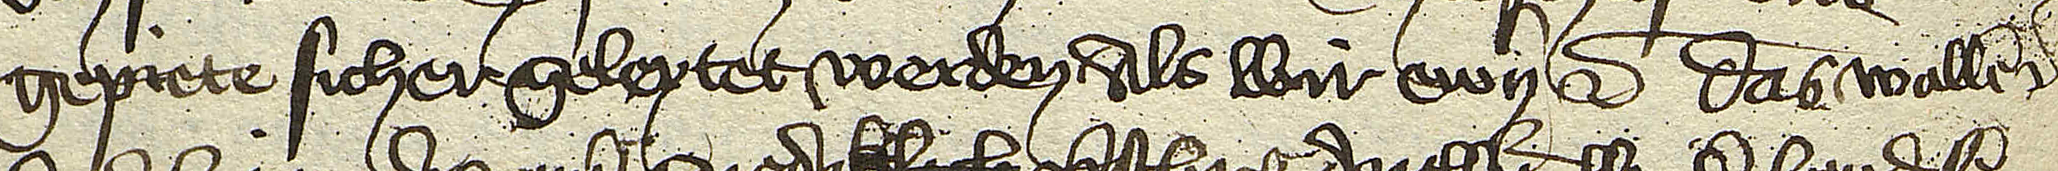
gepiete ſicher geleytet werden / Als wir ewn* ec* das wolle* ec*
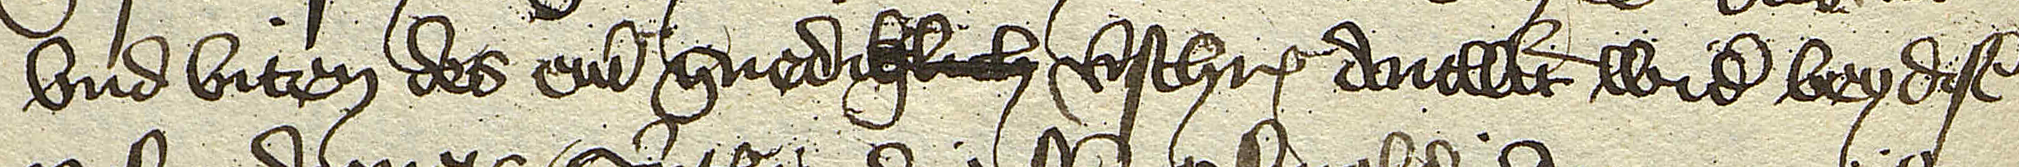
vnd biten des ew* gnediglich v*ſchr* Antwt* wid* bey diſe*
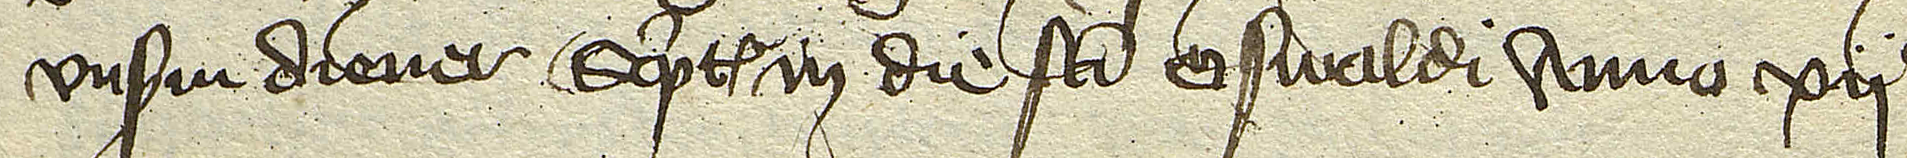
vnſ*m diener / Scpt* in die ſci* Oſwaldi Anno xii*
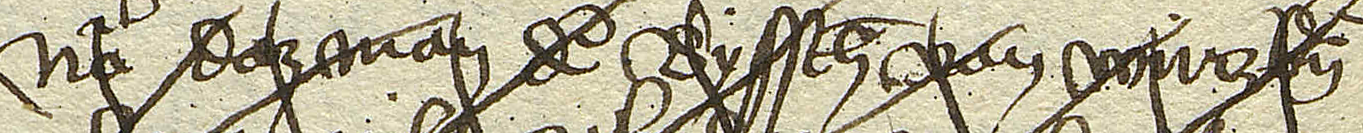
No* daʒ man d* Byſſch* von wircʒb*g
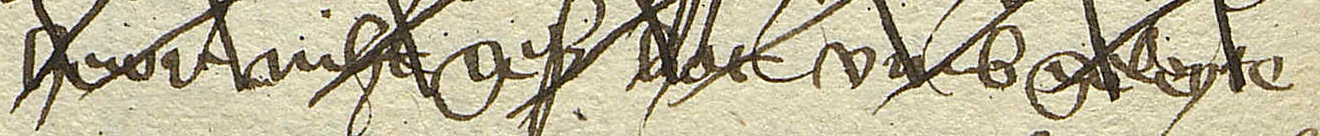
hewr niht geſ* hat vmb geleyte
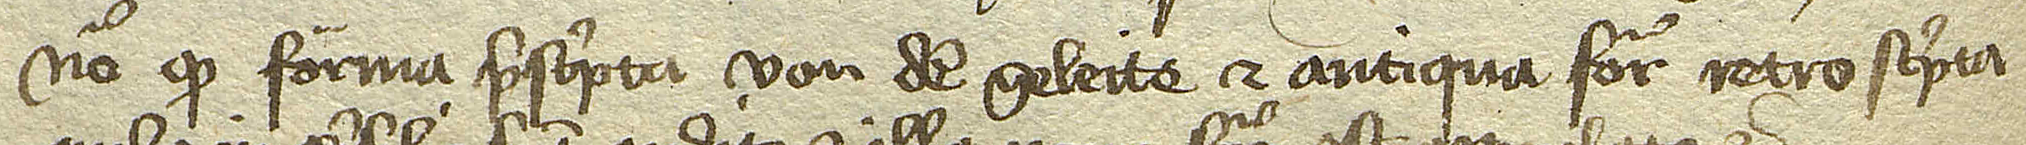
No* q* forma p*ſc*pta von de* geleite @ antiqua for* retro ſc*pta
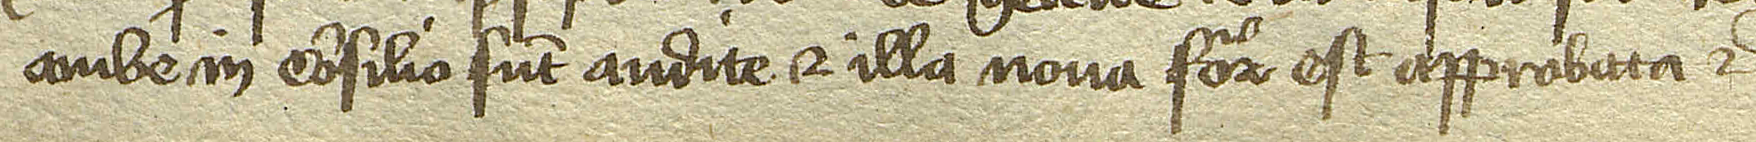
ambe in Co*ſilio ſut* audite @ illa noua for* eſt approbata ec*
